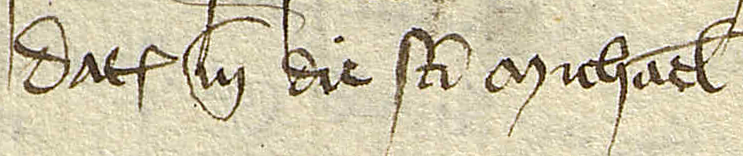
Dat* in die ſci* Michael*
